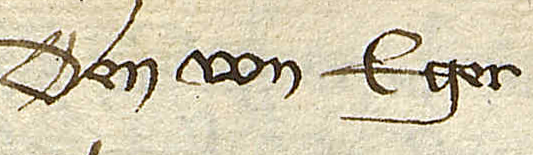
Den von Eger
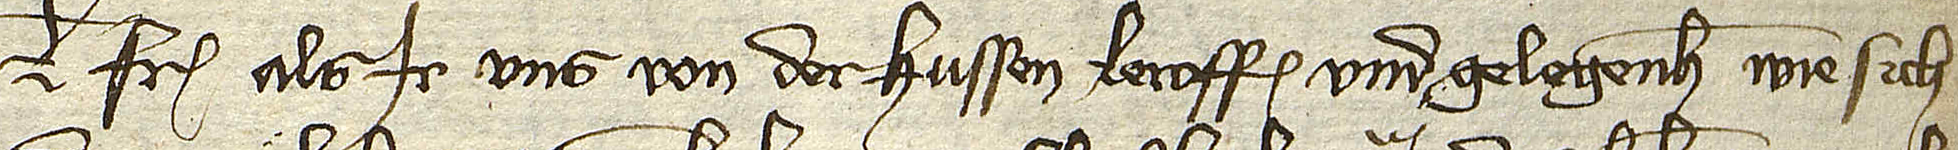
L* fr* als Ir vns von der huſſen lewff* vnd gelegenh* wie ſich
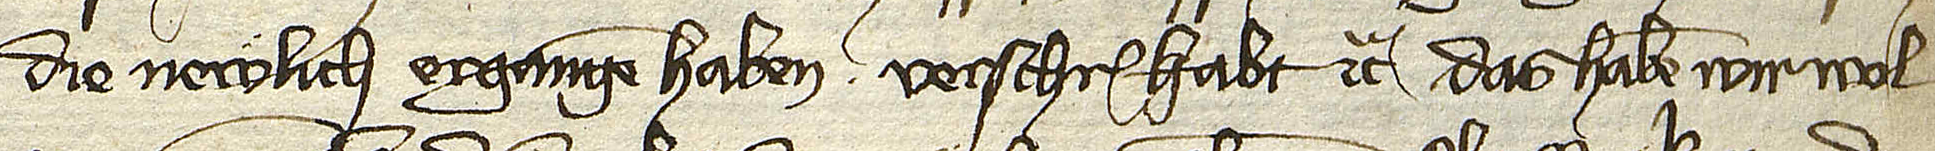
die newlich ergange* haben . verſchr* habt ec* das habe* wir wol
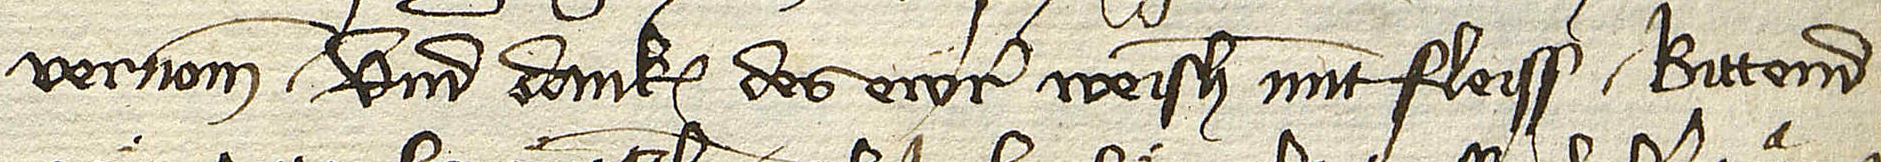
vernom* / Vnd dank* des ew*r weiſh* mit fleiſſ / Bittend
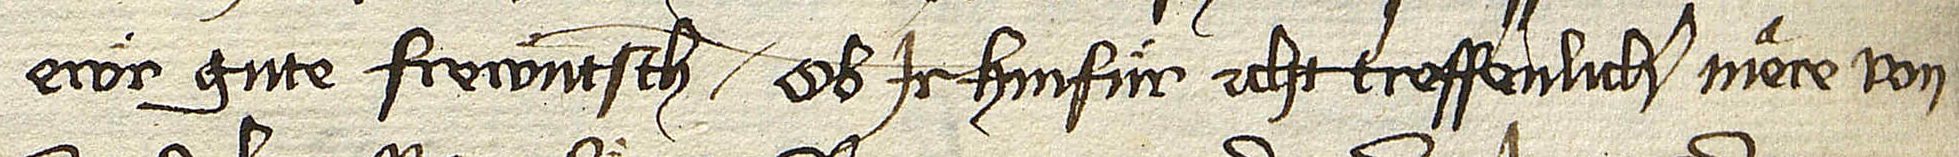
ewr gute frewntſch* / ob Ir hinfür icht treffenlich* mëre von
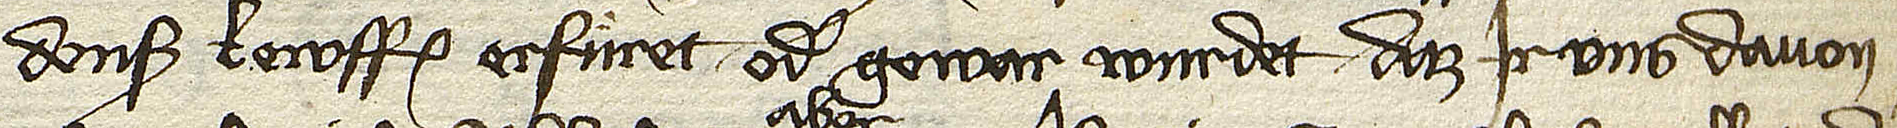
denſ* lewff* erfüret / od* gewar wurdet / daʒ Ir vns dauon
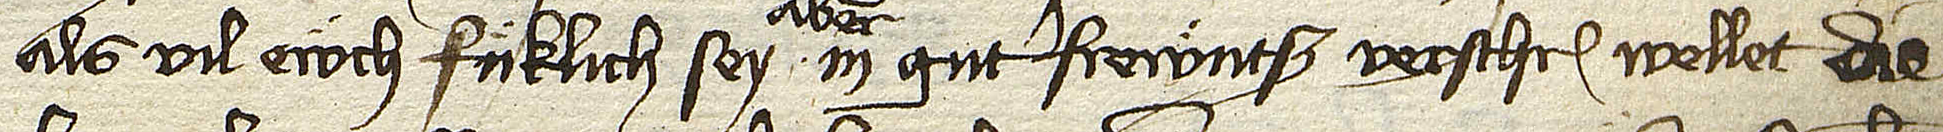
als vil ewch füklich ſey in gut* frewntſ* verſchr* wellet die
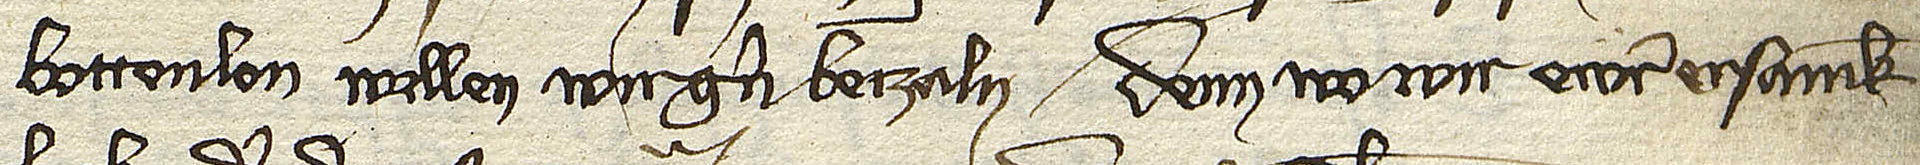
bottenlon wellen wir g*n becʒaln / Denn wo wir ew*r erſamk*
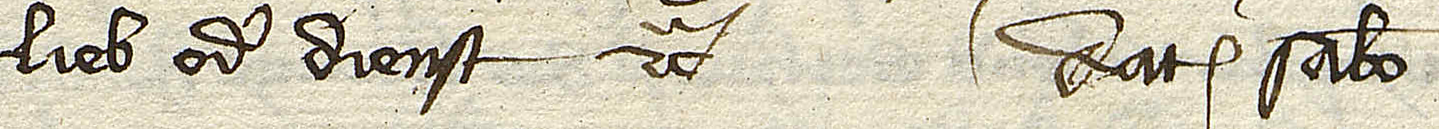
lieb od* dienſt ec* Dat* ſabo*
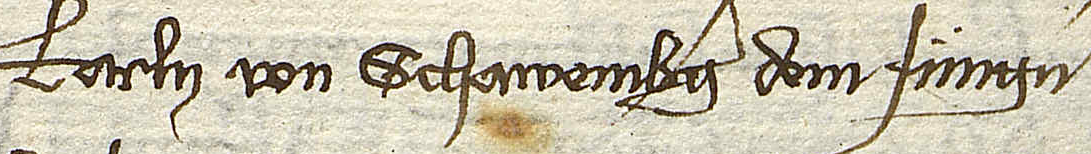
Karln von Schawemb*g dem Iüng*n
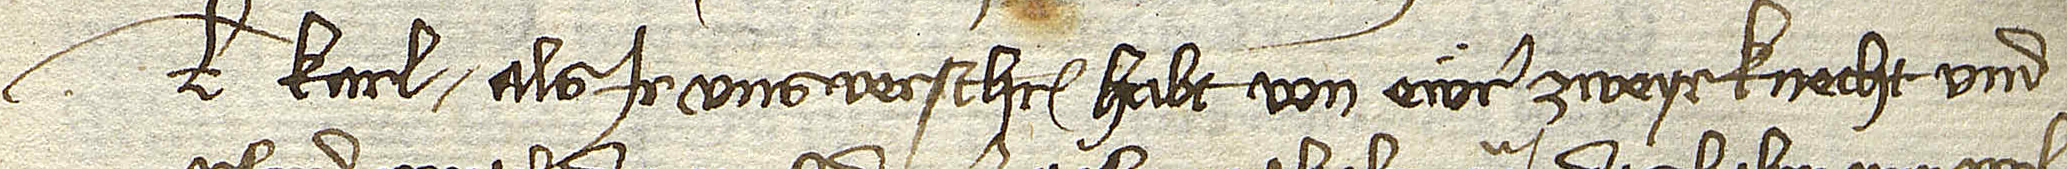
L* karl / als Ir vns verſchr* habt von ew*r ʒweyr knecht vnd
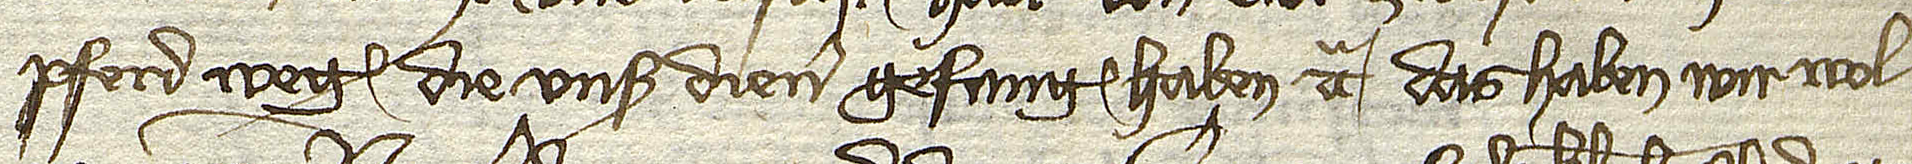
pferd weg* die vnſ* dien* gefang* haben ec* das haben wir wol
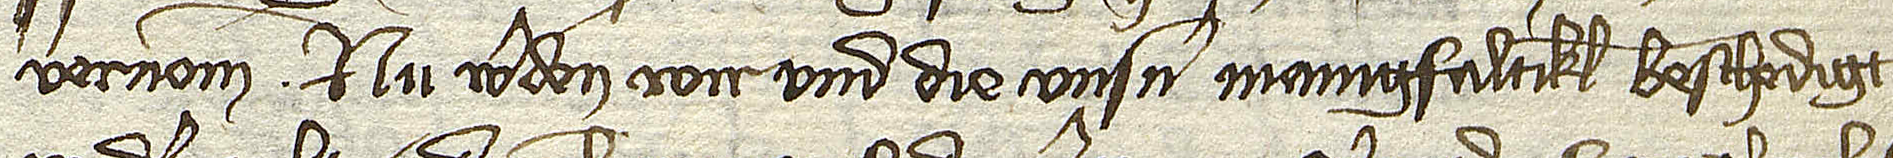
vernom* . Nu w*den wir vnd die vnſ*n manigfaltikl* beſchedigt
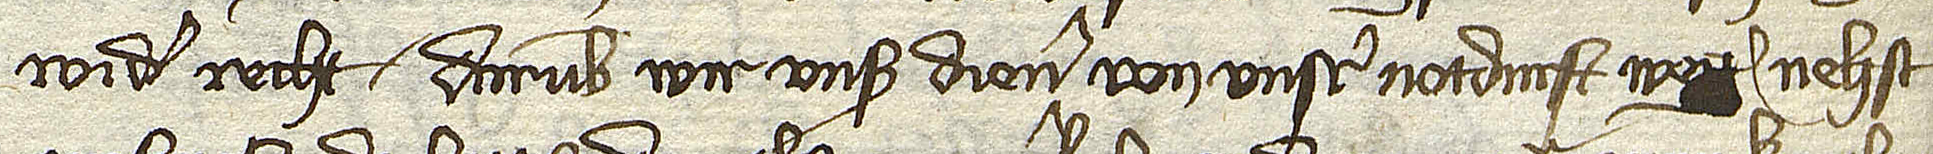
wid* recht / Daru*b wir vnſ* dien* von vnſ*r notdurft weg* nehſt
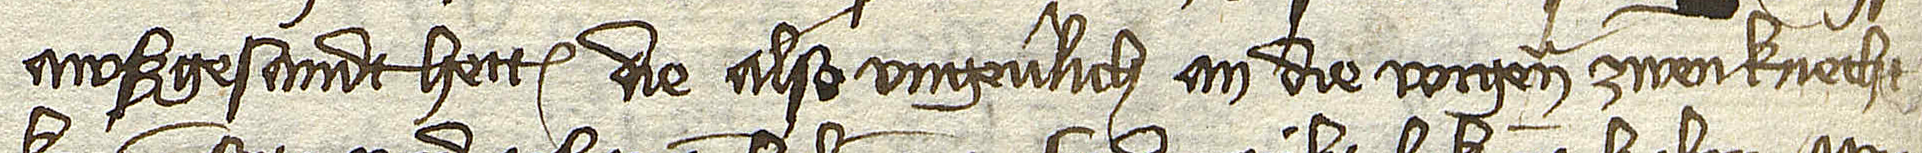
awſʒgeſandt hett* die alſo vngeu*lich an die vorgen* ʒwen knecht
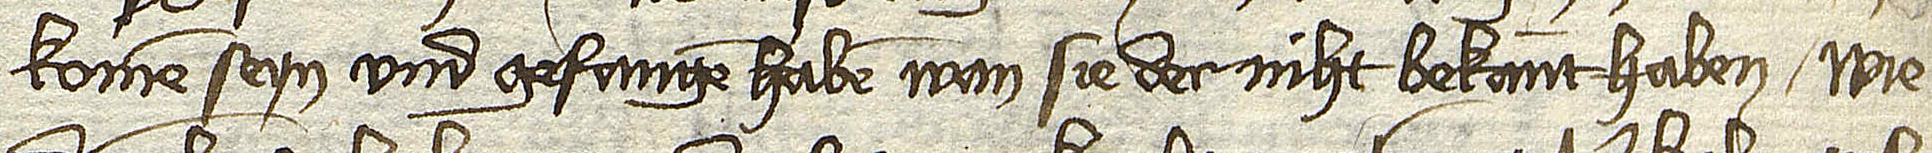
kome* ſeyn vnd gefange* habe* wan ſie der niht bekant* haben / wie
